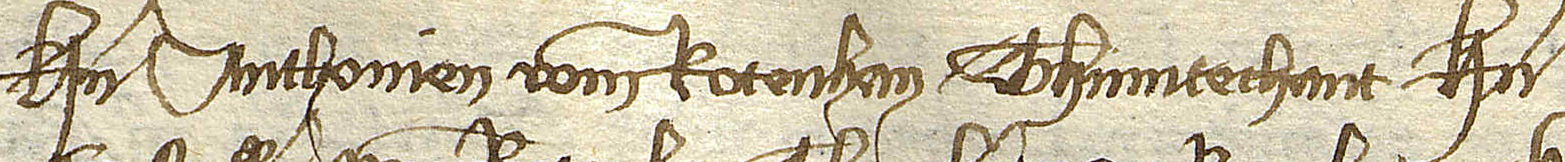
H*n Anthonien von Rotenhan Thumtechant / H*n
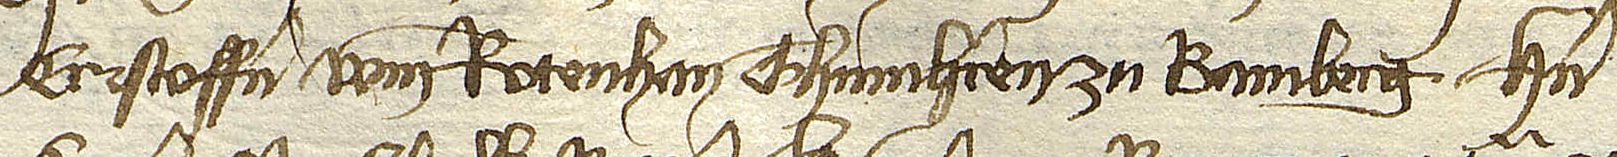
Criſtoff*n von Rotenhan Thumh*ren ʒu Bamberg / H*n
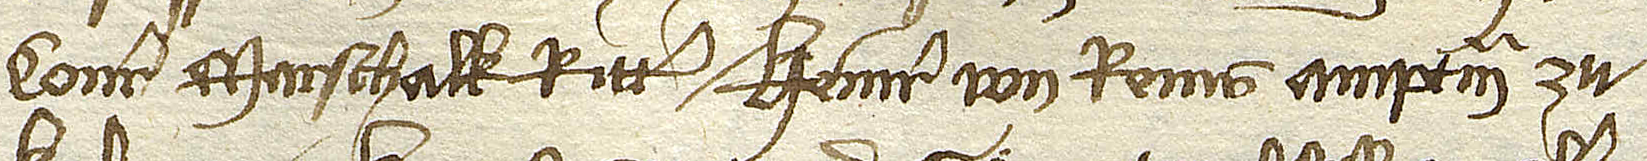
Conr* Marſchalk Ritt* / Heinr* von Rems amptm* ʒu
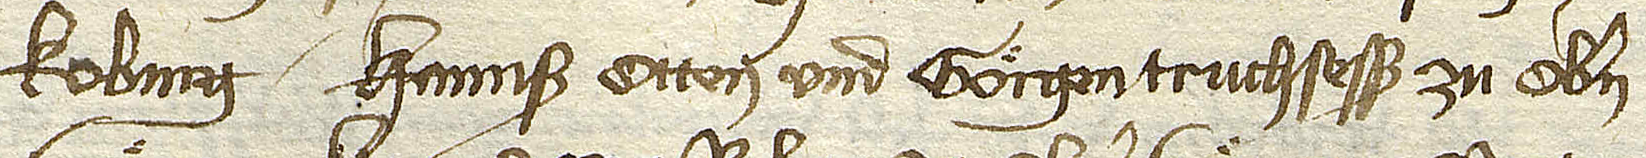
koburg / Hannſ* Otten vnd Görgen truchſeſſ* ʒu Ob*n
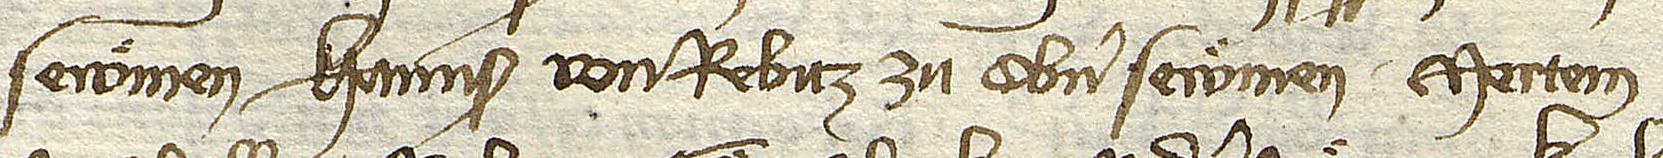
ſewmen Hannſ* von Rebicʒ ʒu Obn* ſewmen / Mertein
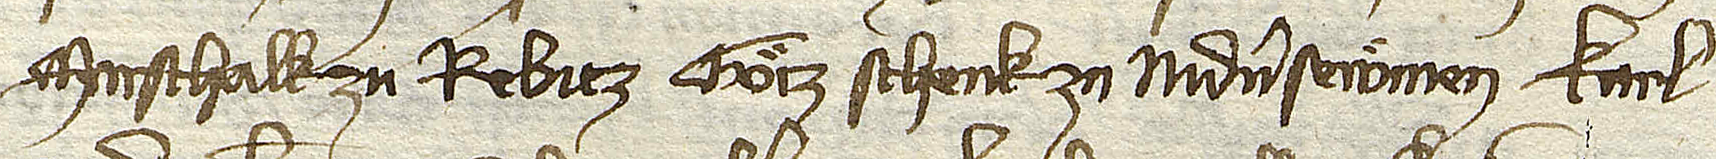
Marſchalk ʒu Rebicʒ Göcʒ ſchenk ʒu Nid*n ſewmen Karl
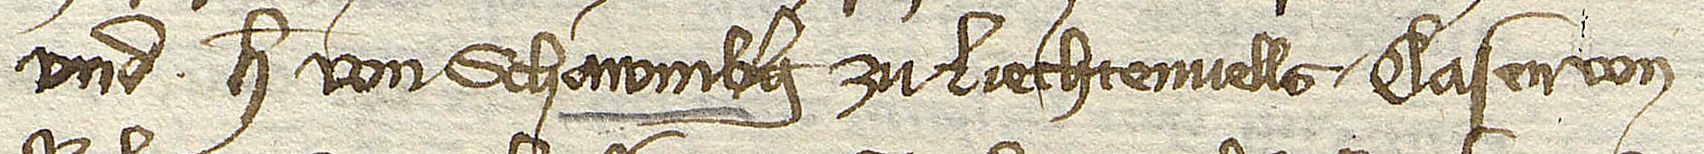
vnd . H* von Schawmb*g ʒu Liechtenuells / Claſen von
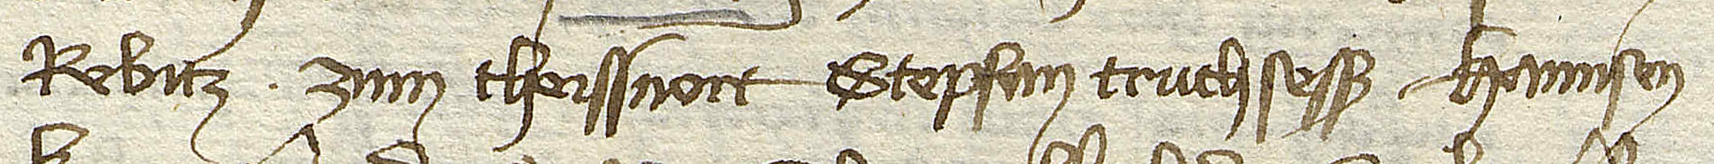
Rebicʒ . ʒum theiſſnort Stepfan truchſeſſ* / Hannſen
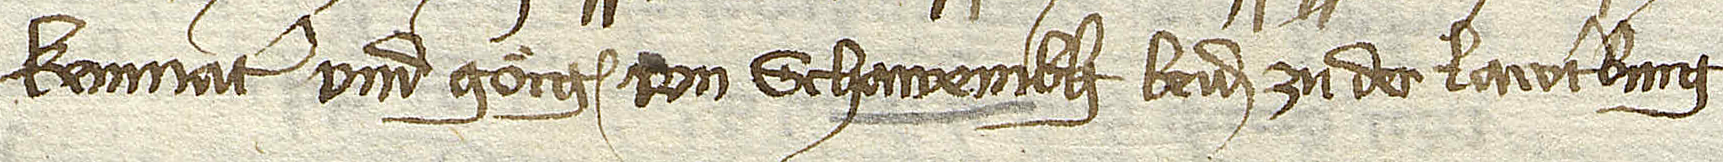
Kemnat* vnd görg* von Schawemb*g beid* ʒu der Lawt*burg
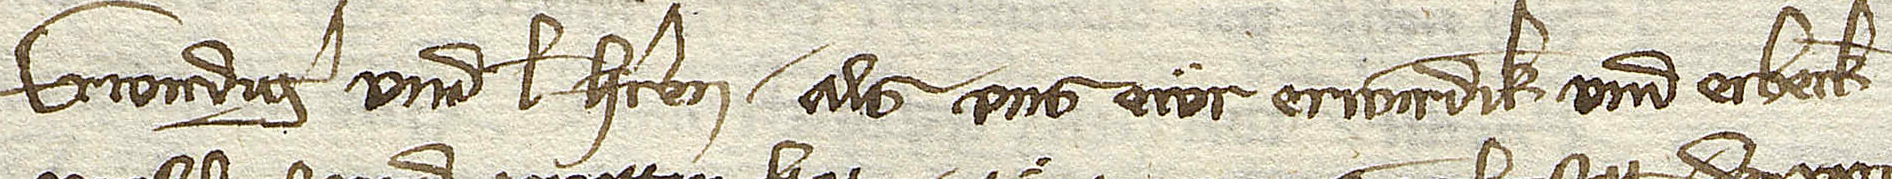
Erwirdig* vnd l* h*ren / als vns ewr erwirdik* vnd erberk*
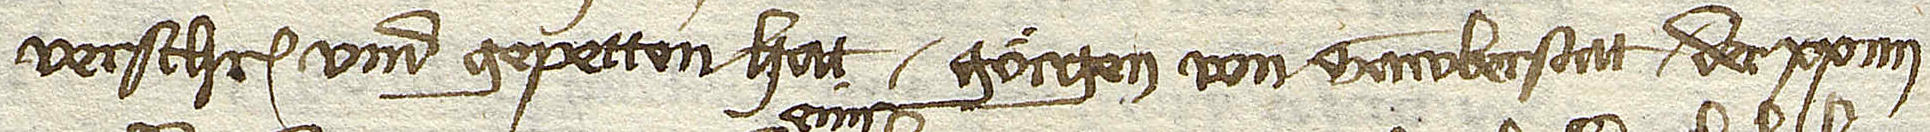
verſchr* vnd gepetten hat / görgen von Gawberſtat / der xxiiii
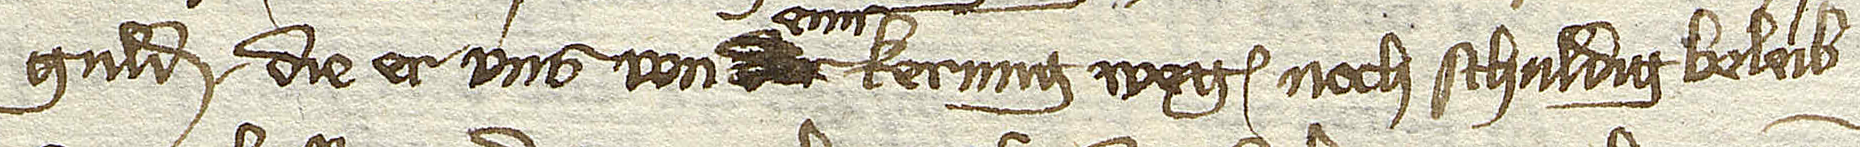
guld* / die er vns von der kerung weg* noch ſchuldig beleib
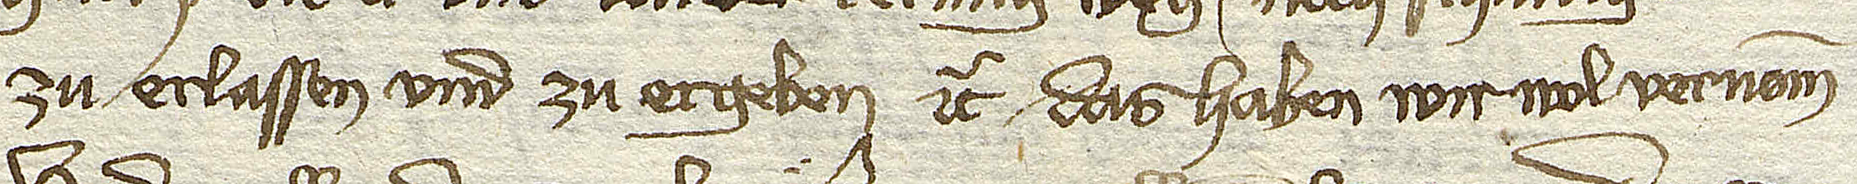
ʒu erlaſſen vnd ʒu ergeben ec* / das haben wir wol vernom*
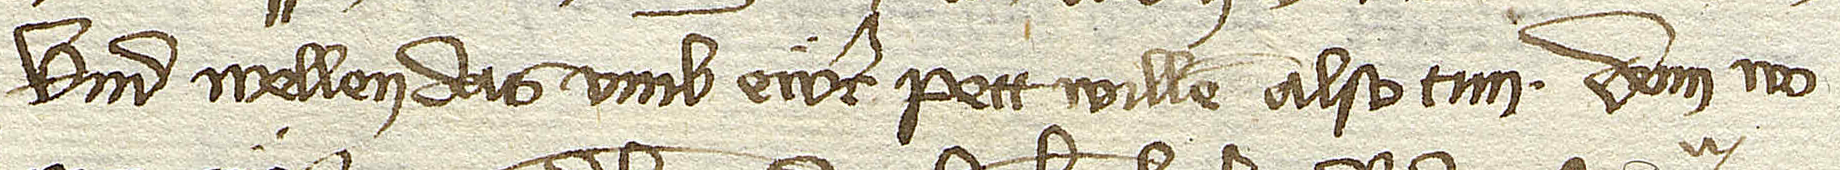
Vnd wellen das vmb ew*r pett wille* alſo tun . Denn wo
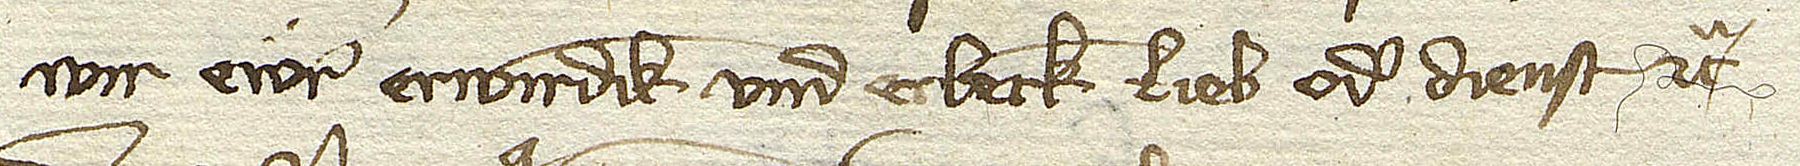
wir ew*r erwirdik* vnd erberk* lieb od* dienſt ec*
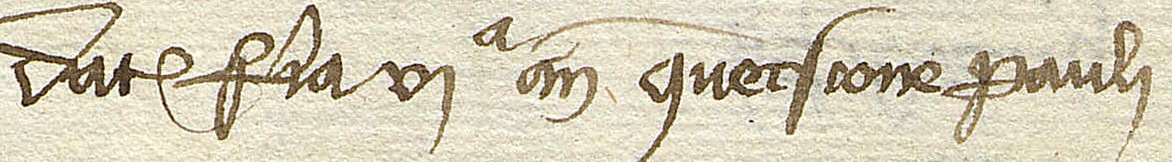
Dat* fia* vi* an* *uerſione Pauli
